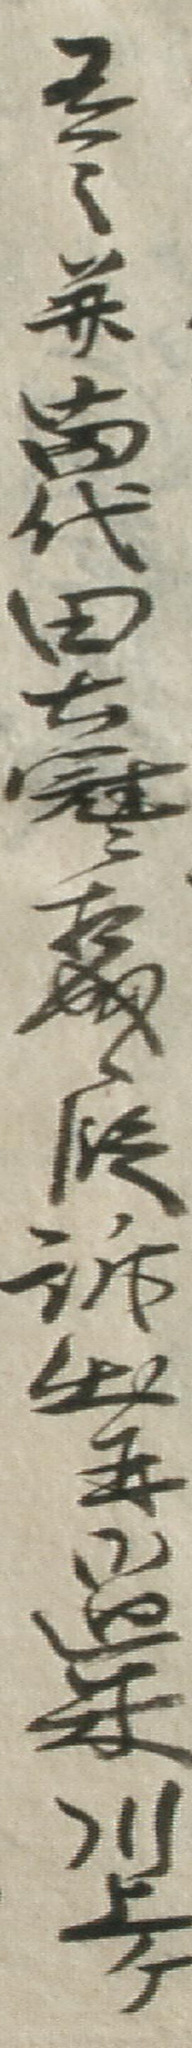有之并苗代田土冠二相成候段訴出并御廻米
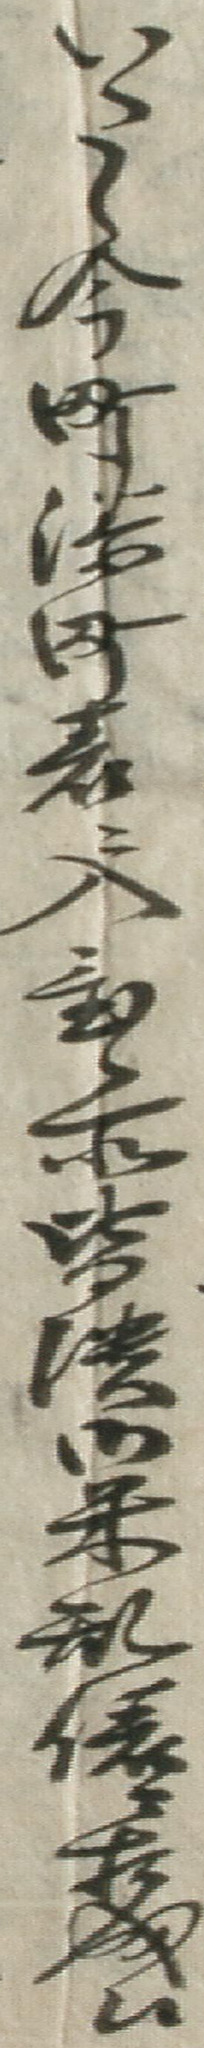いたし今町湊町倉二入置候所皆潰御米乱俵二
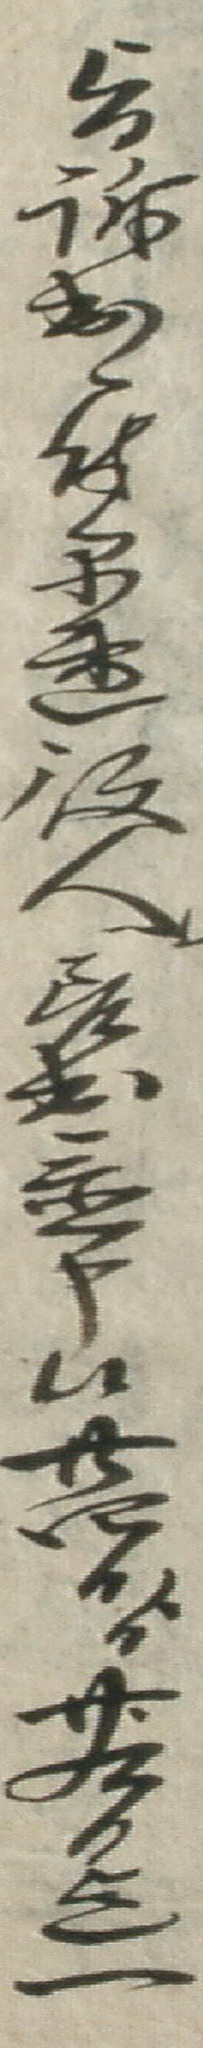旨訴出候二付早速役人差出置申候廿四日ゟ
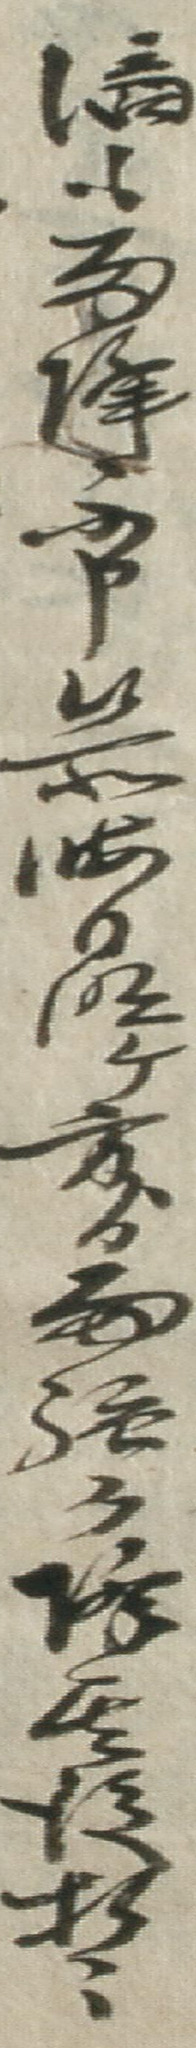滴も雨降不申候所晦日明ヶ方ゟ雨強ク降り其後折々
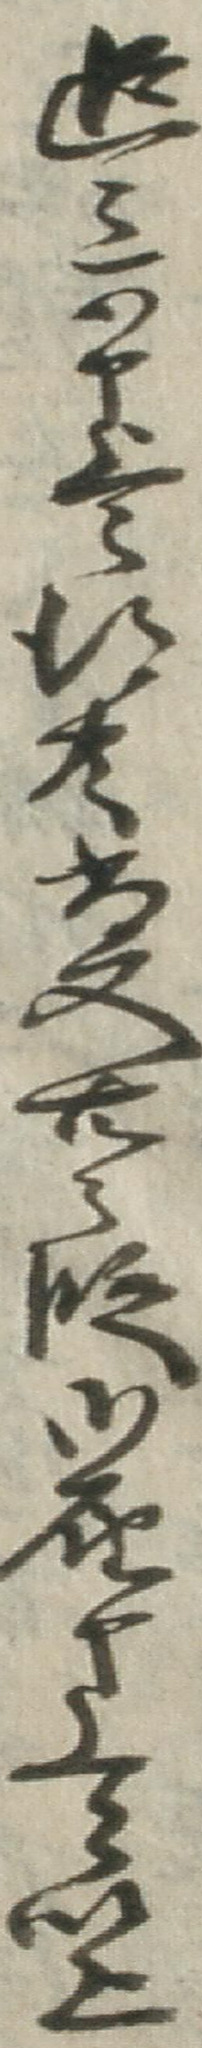追々可申上候得共尚又右之段御届申上候以上
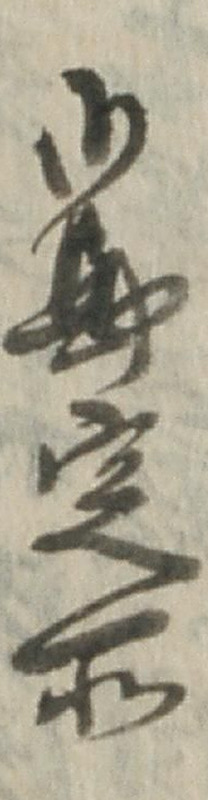御勘定所
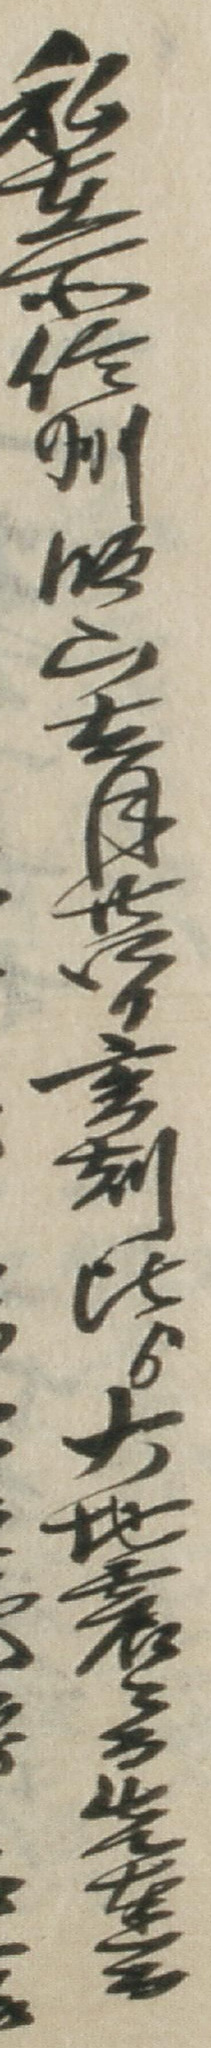私在所信州飯山去月廿四日夜亥刻比ゟ大地震二而先達而
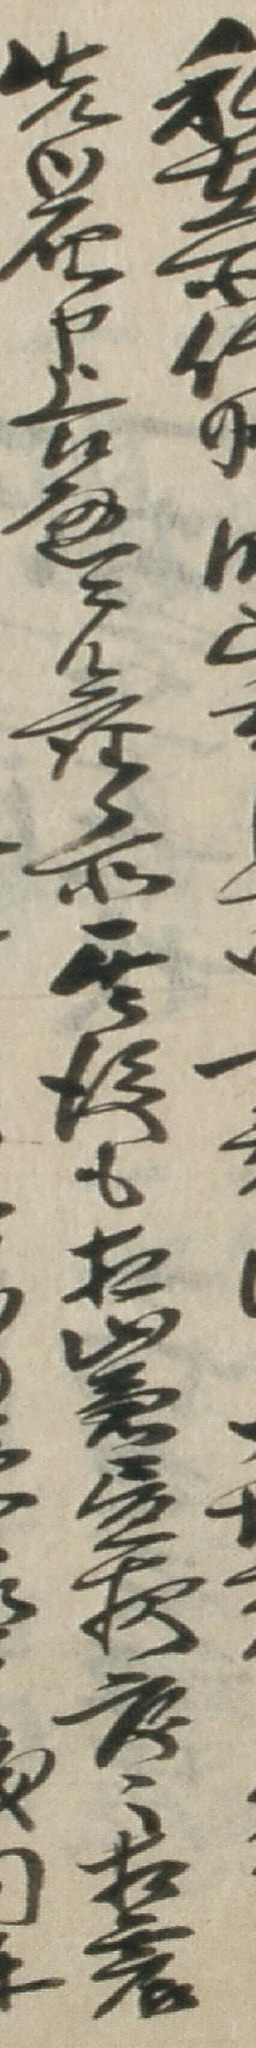先御届申上置候通二御座候所其後も相止兼昼夜度々相震
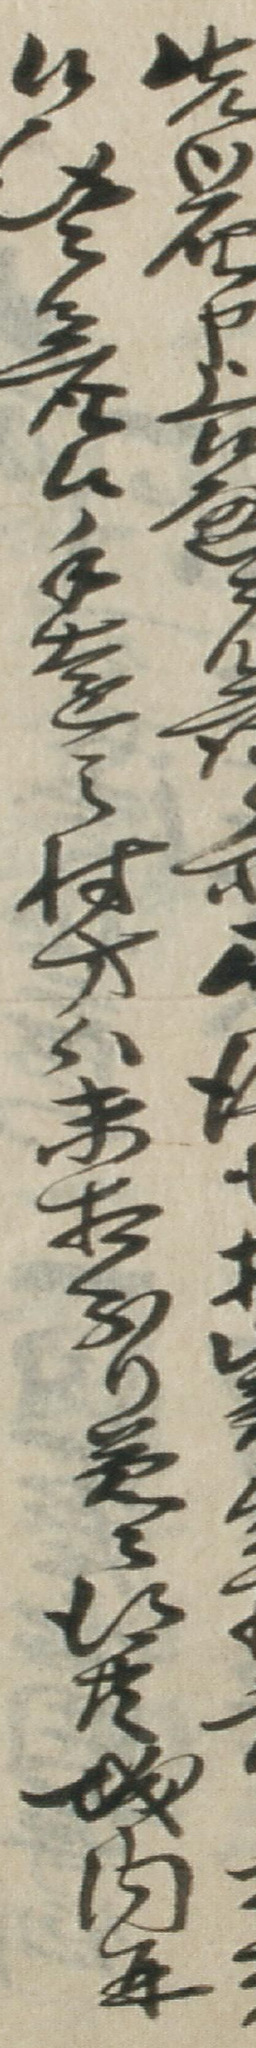候趣二御座候手遠村方ハ未相分り兼候得共城内并
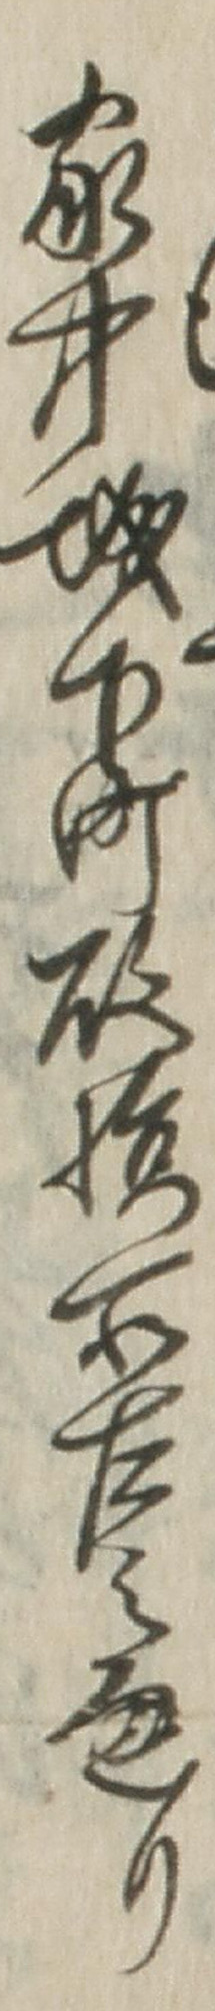家中城下町破損所左之通り
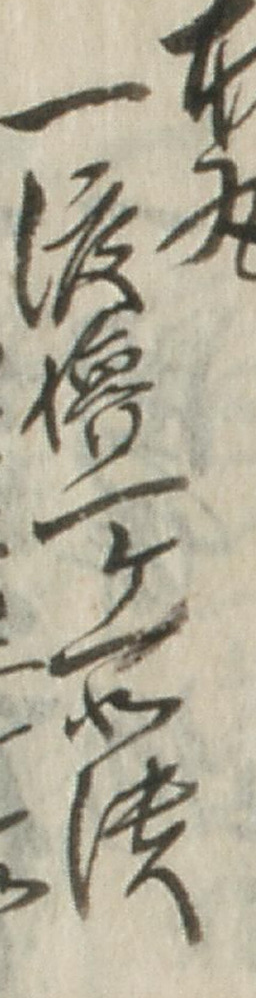一腰掛一ヶ所潰
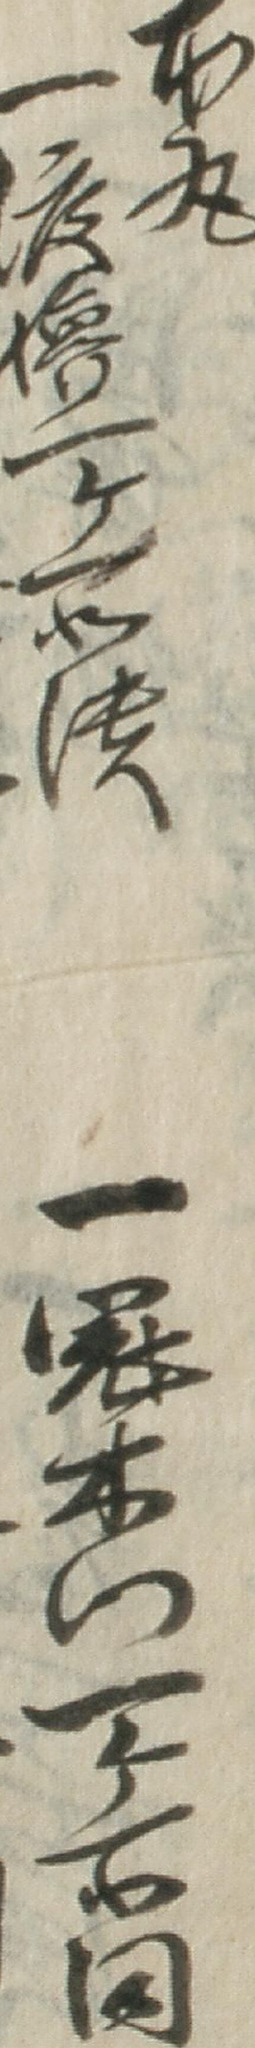一渡櫓一ヶ所潰一冠木門一ヶ所右同
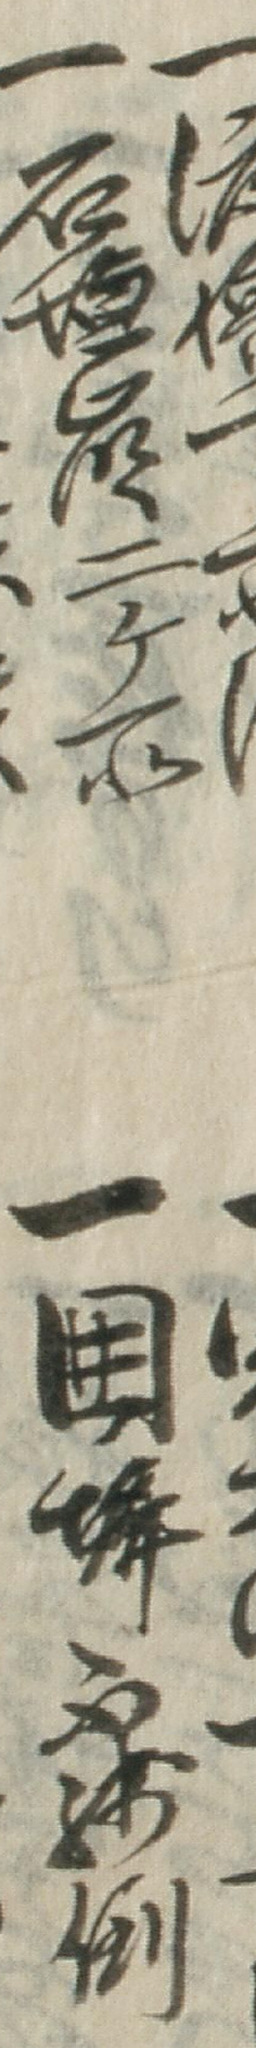一石垣崩二ヶ所一囲塀不残倒
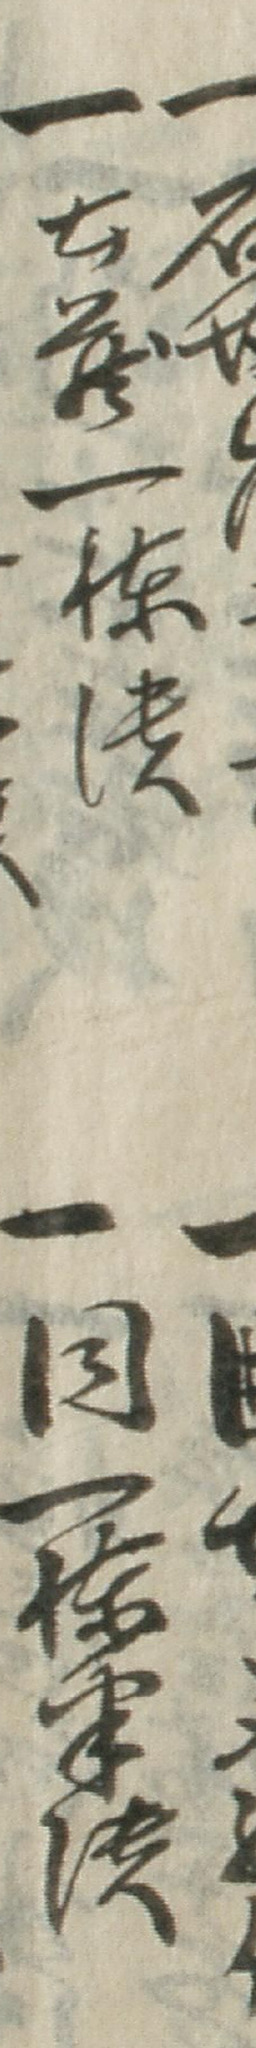一土蔵一棟潰一同一棟半潰
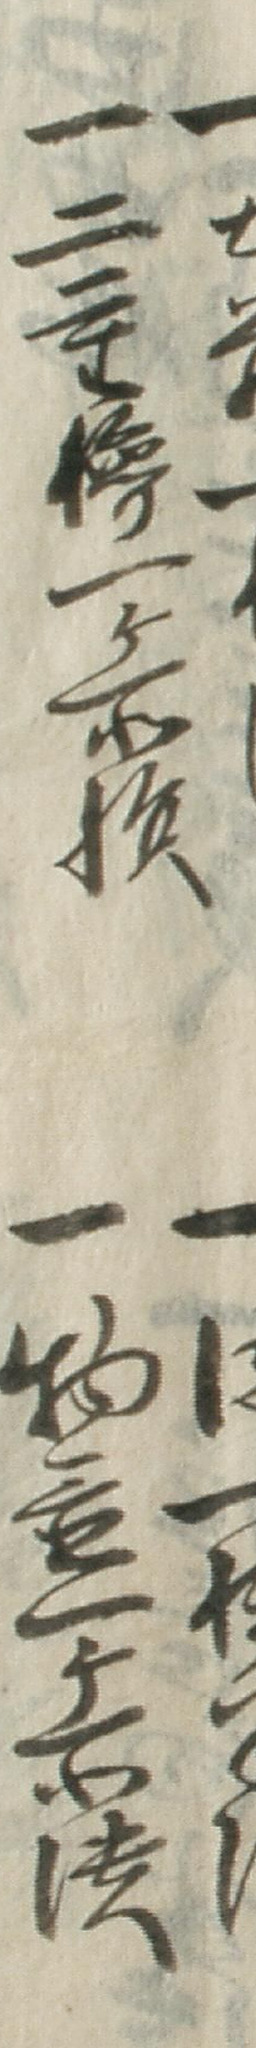一二重櫓一ヶ所損一物置一ヶ所潰
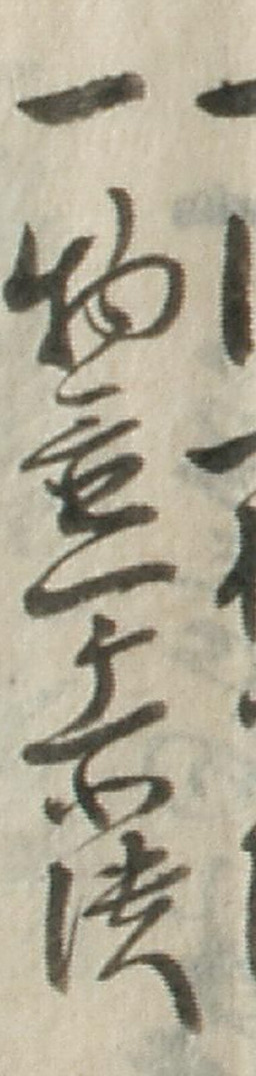一腰掛一ヶ所潰
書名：信濃國地震實録記
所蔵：東京大学地震研究所図書室 Earthquake Research Institute Library, The University of Tokyo, JAPAN
